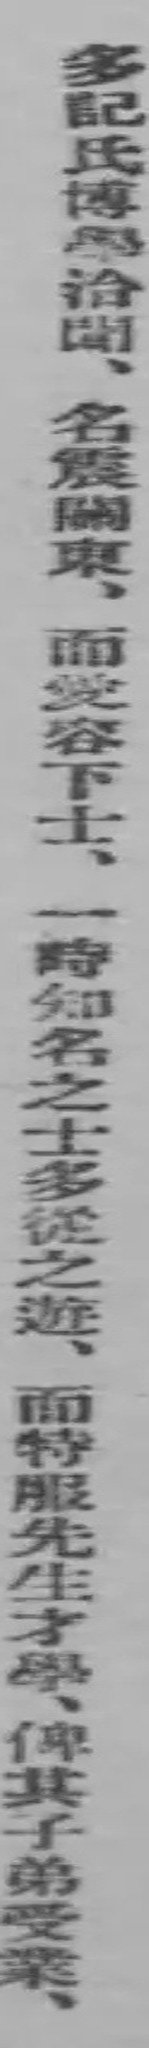多記氏博学洽聞、名震関東、而愛容下士、一時知名之士多従之遊、而特服先生才学、俾其子弟受業、
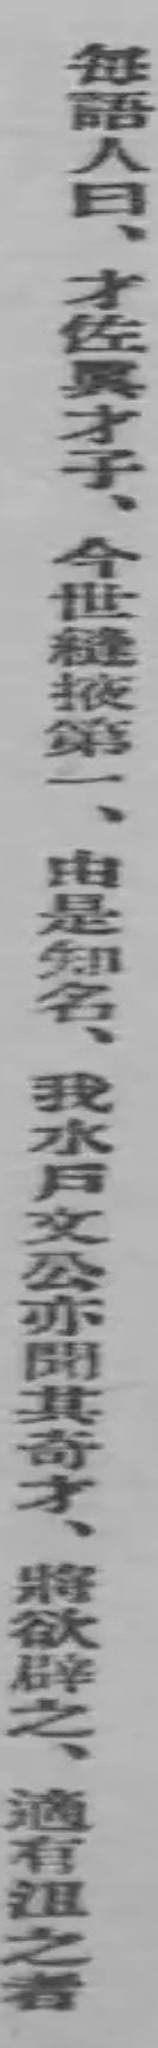毎語人曰、才佐眞才子、今世縫掖第一、由是知名、我水戸文公亦聞其奇才、将欲辟之、適有沮之者
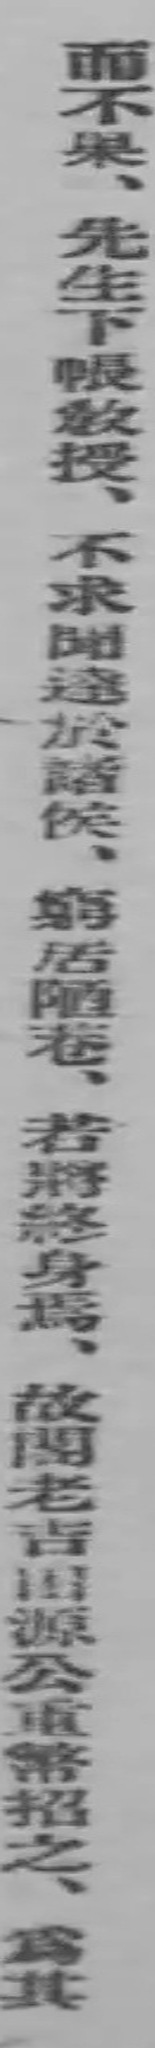而不果、先生下帳教授、不求聞達於諸侯、窮居陋巷、若将終身焉、故閣老吉田源公重幣招之、為其
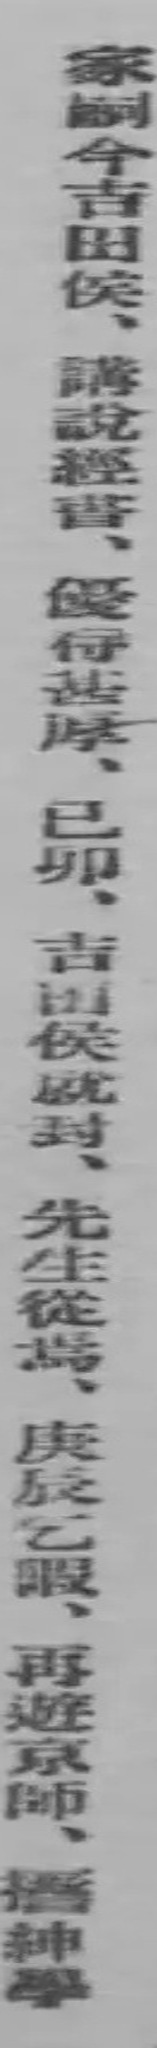家嗣今吉田侯、講説経書、優待甚厚、巳卯、吉田侯就封、先生従焉、庚辰乞暇、再遊京師、搢紳学
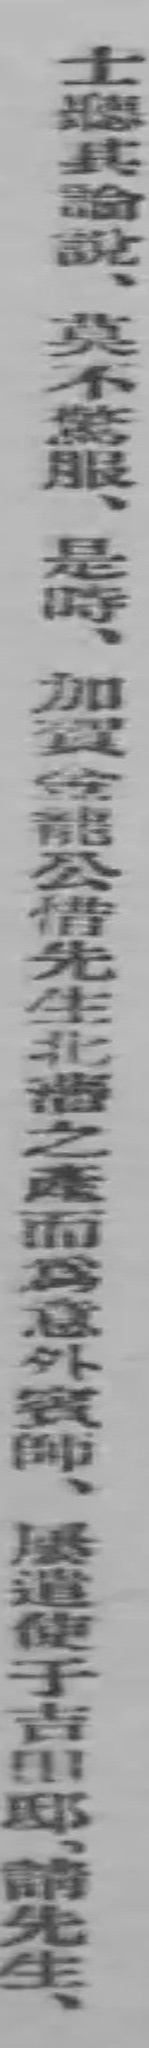士聴其論説、莫不驚服、是時、加賀金龍公惜先生北藩之産而為意外賓師、屡遣使于吉田邸、請先生、
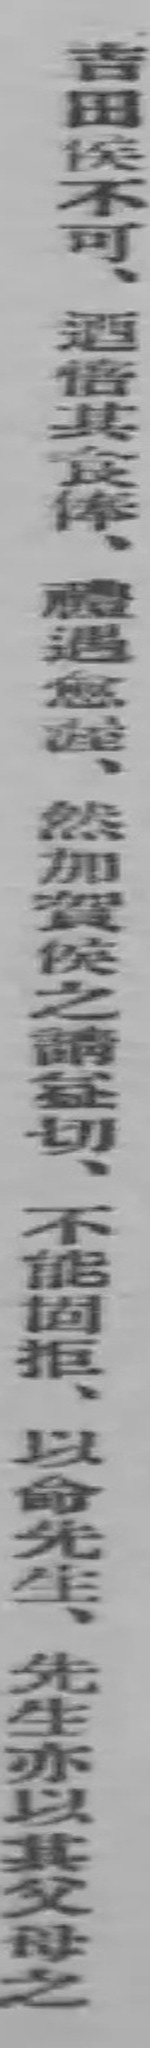吉田侯不可、迺悟其食俸、礼遇愈渥、然加賀侯之請益切、不能固拒、以命先生、先生亦以其父母之
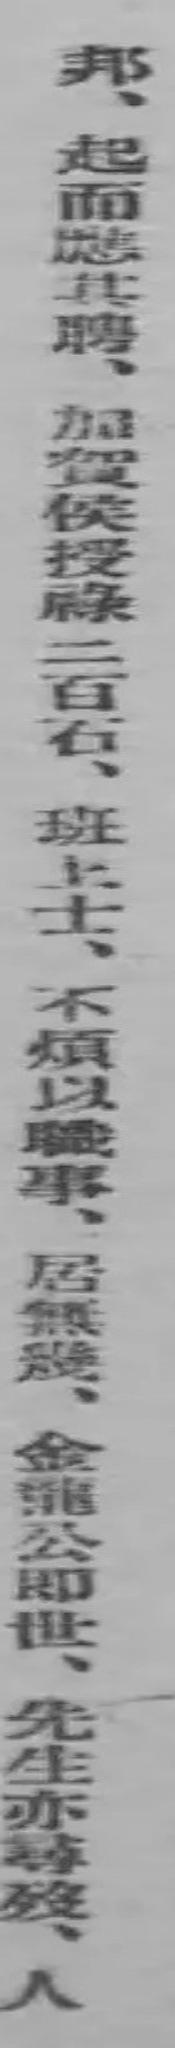邦、起而応其聘、加賀侯授禄二百石、班上士、不煩以職事、居無幾、金龍公即世、先生亦尋歿、人
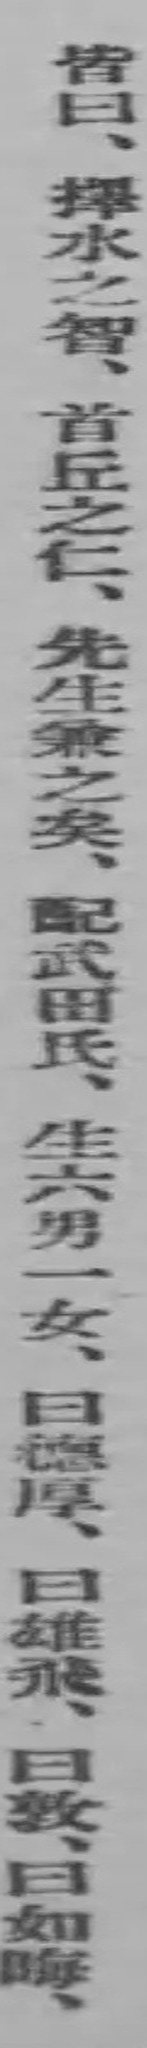皆曰、擇水之智、首丘之仁、先生兼之矣、配武田氏、生六男一女、曰穂厚、曰雄飛、曰敦、曰如晦、
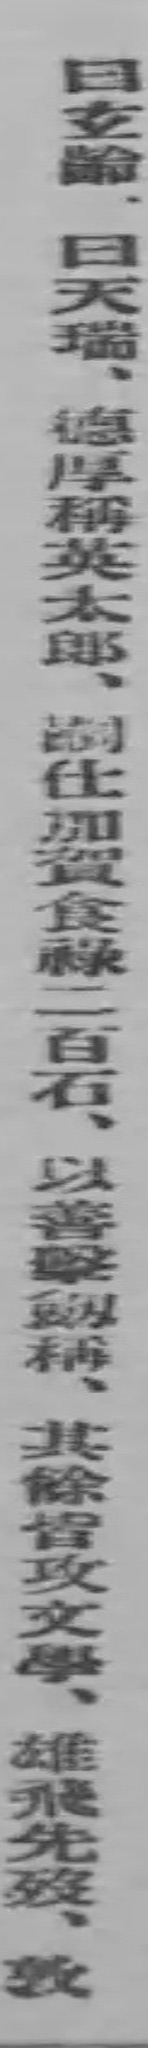曰玄齢、曰天瑞、徳厚称英太郎、嗣仕加賀食禄二百石、以善撃劔称、其余皆攻文学、雄飛先歿、敦
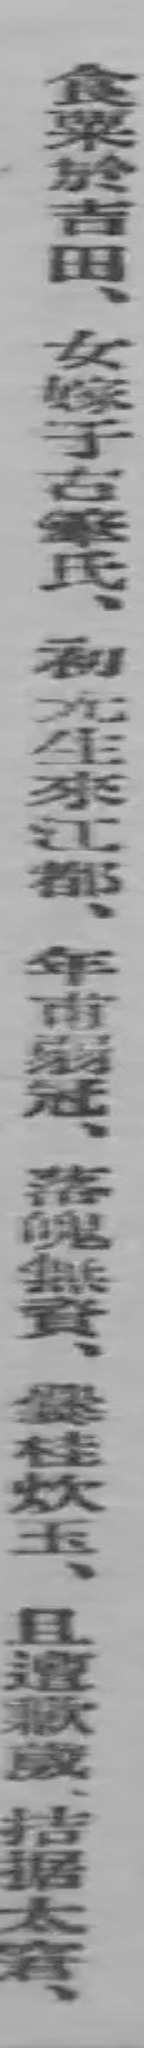食粟於吉田、女嫁于古筆氏、初先生来江都、年甫弱冠、落魄無資、爨桂炊玉、且遭歉歳、拮据太窘、
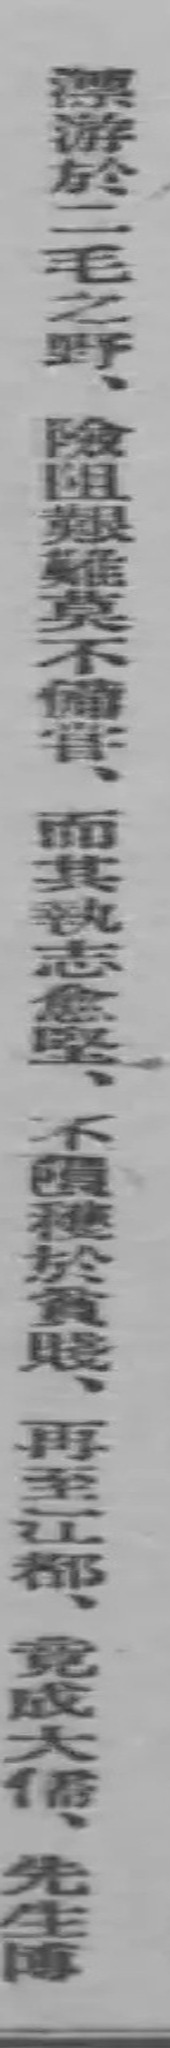漂游於二毛之野、険阻艱難莫不備甞、而其執志愈堅、不隕穫於貧賤、再至江都、竟成大儒、先生博
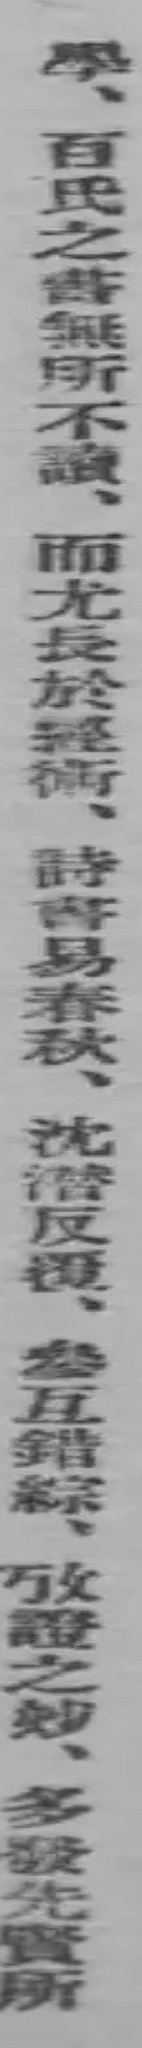学、百氏之書無所不読、而尤長於経術、詩書易春秋、沈潜反覆、参互錯綜、攷證之妙、多発先賢所
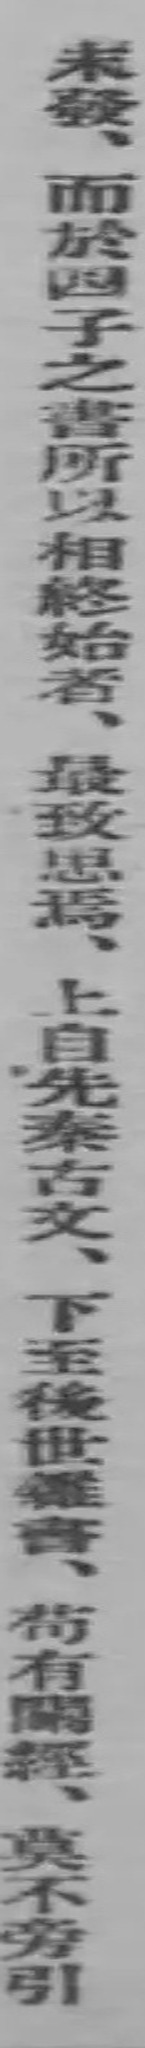未発、而於四子之書所以相終始者、最致思焉、上自先秦古文、下至後世雑書、苟有経、莫不旁引
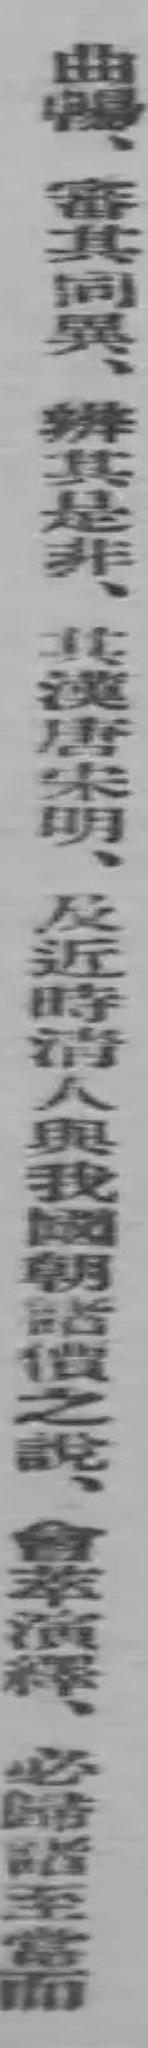曲暢、審其同異、弁其是非、其漢唐宋明、及近時清人與我国朝諸価之説、会萃演繹、必帰諸至当而
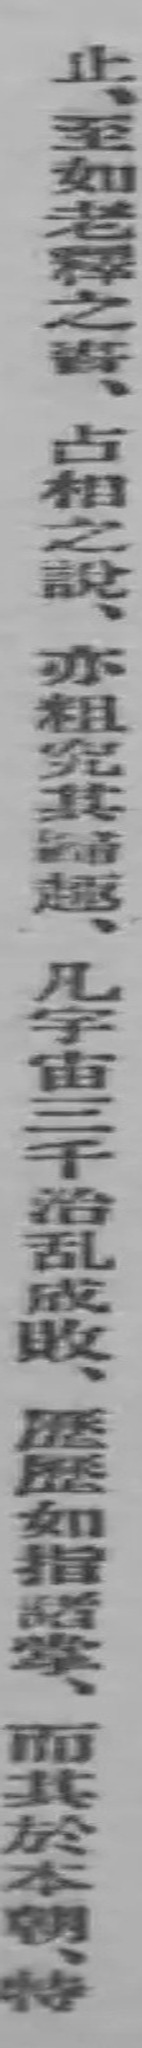止、至如老釈之書、占相之説、亦粗究其帰趣、凡宇宙三千治乱成敗、歴歴如指諸掌、而其於本朝、特
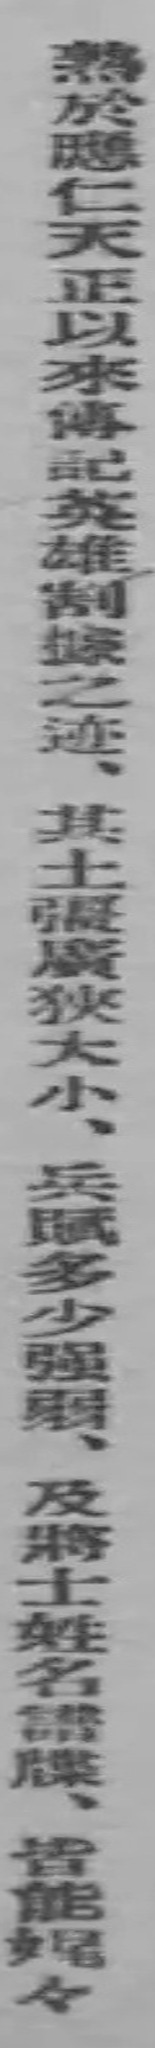熟於応仁天正以来伝記英雄割拠之迹、其土彊広狭大小、兵賦多少強弱、及将士姓名譜牒、皆能娓々
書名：豊橋市史談
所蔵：国立国会図書館 National Diet Library, JAPAN
